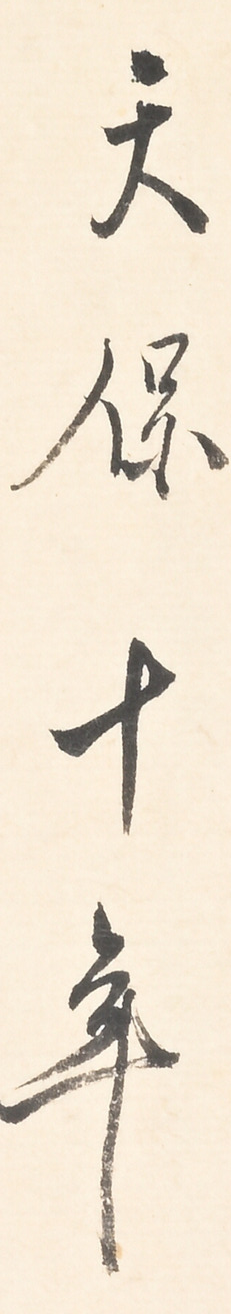天保十年
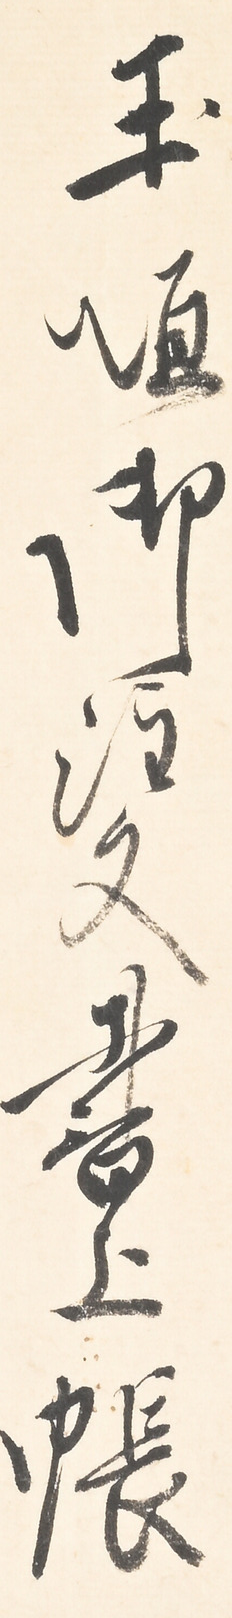玉垣御注文書上帳

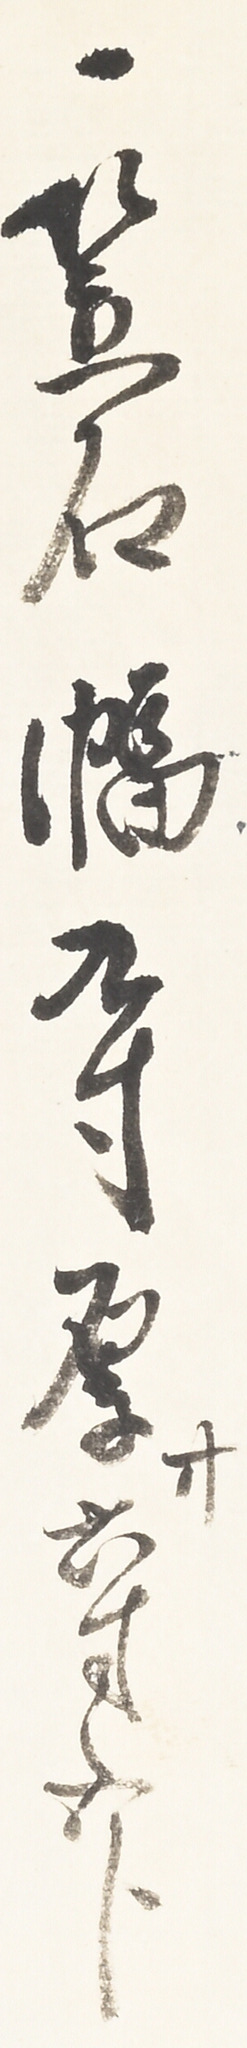一笠石幅九寸厚サ六寸五分
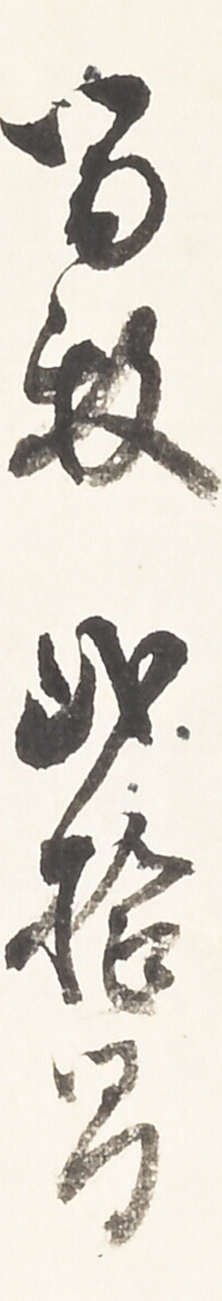間数弐拾間
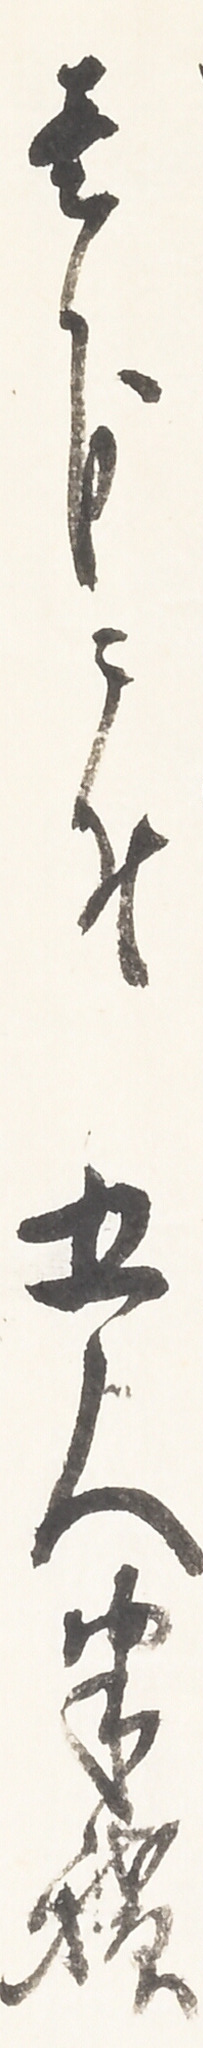壱本ニ付五人半積
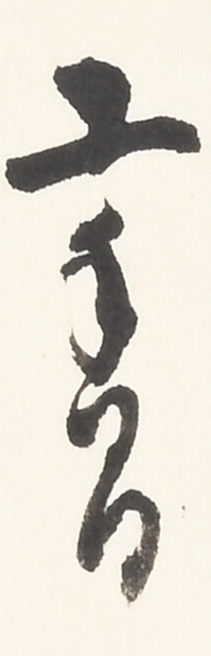工手間
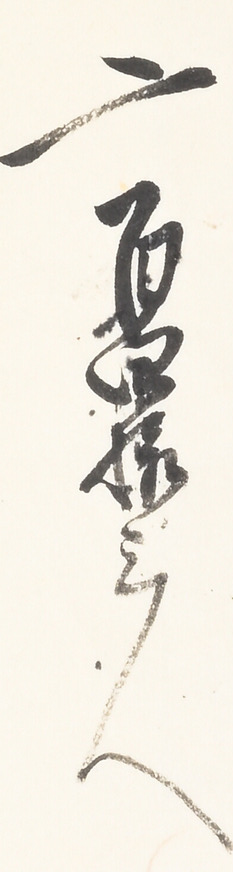〆百四拾三人
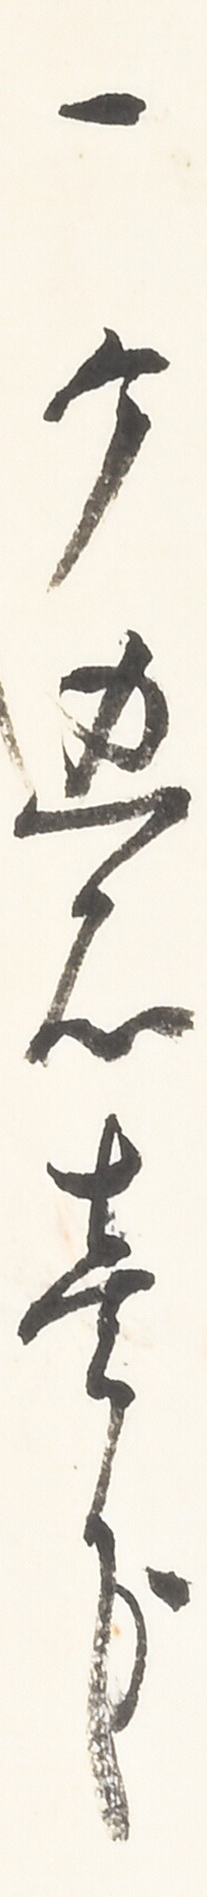一ケ込石壱本
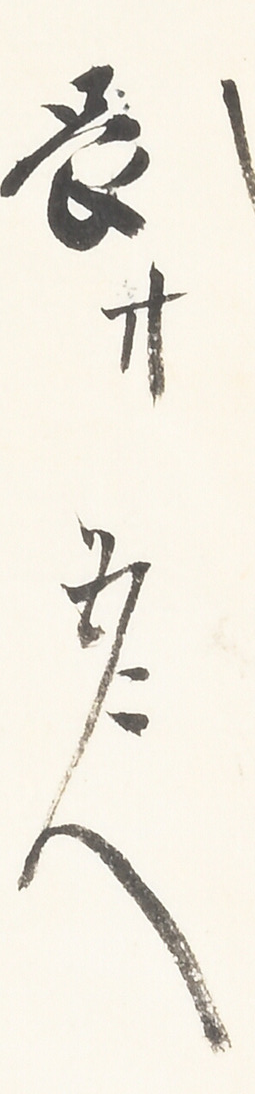長サ五尺
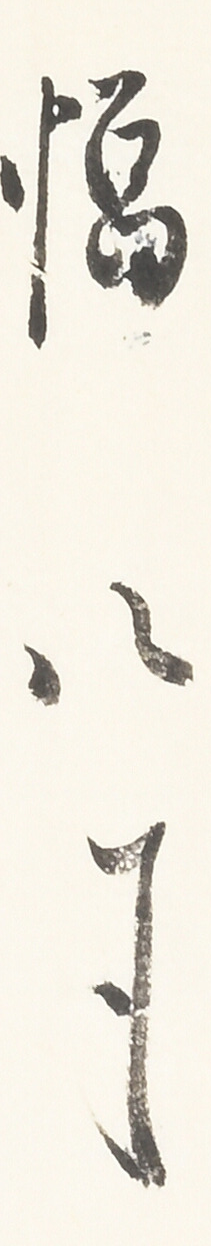幅八寸
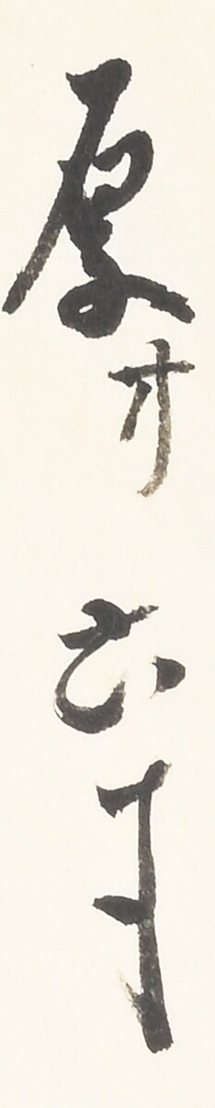厚サ六寸

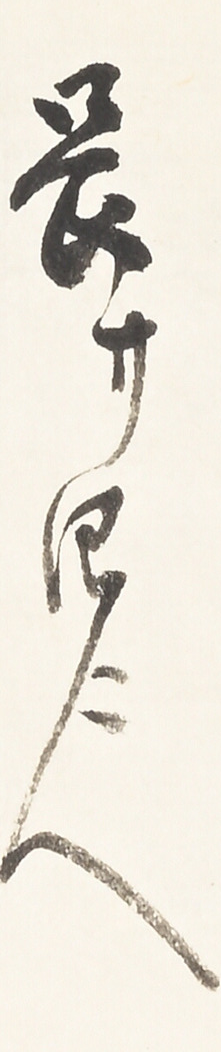長サ四尺
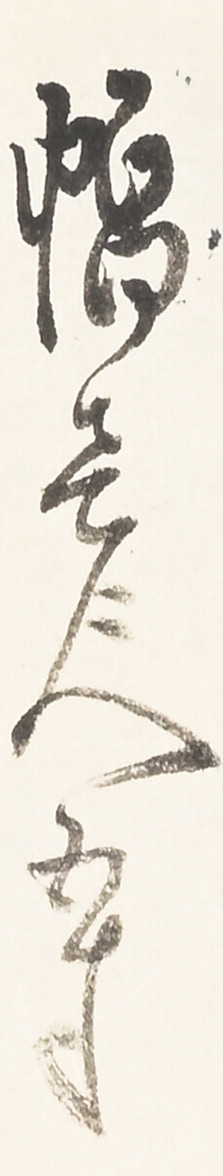幅壱尺五寸
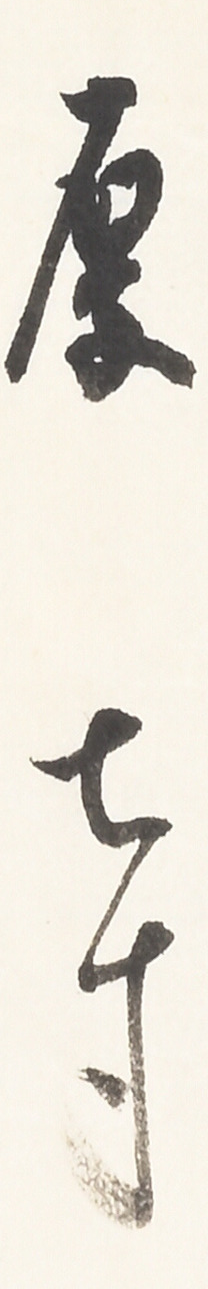厚七寸
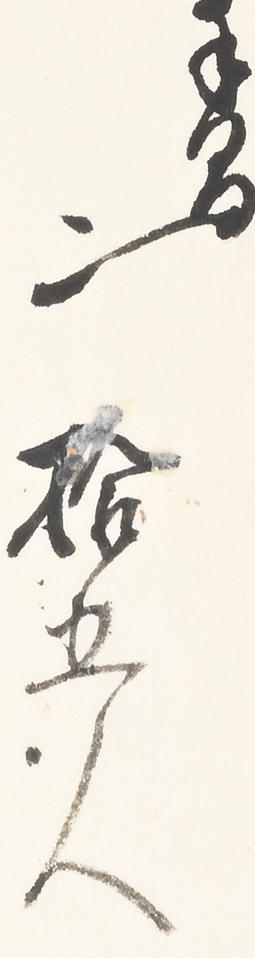〆拾五人
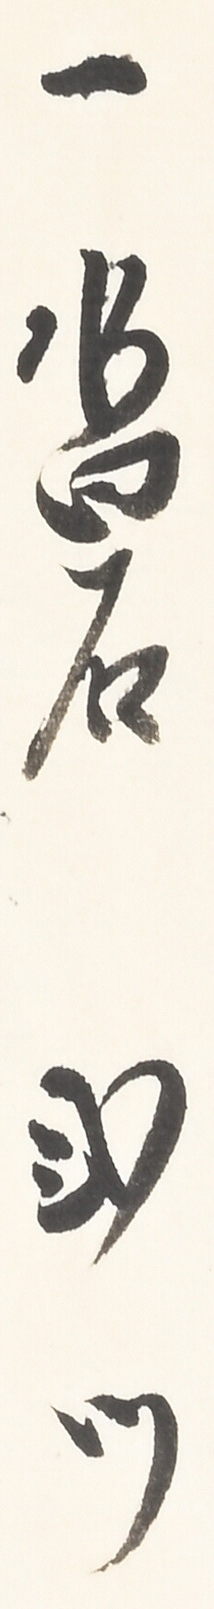一沓石弐ツ
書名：天保十年亥六月日玉垣御注文書上帳
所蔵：伊那市立高遠町図書館・合同会社AMANE
